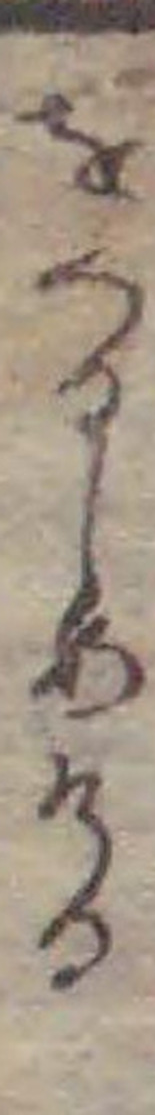をくるしめける
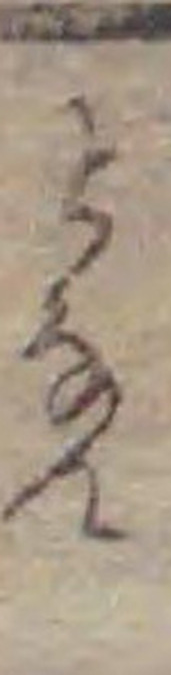となん

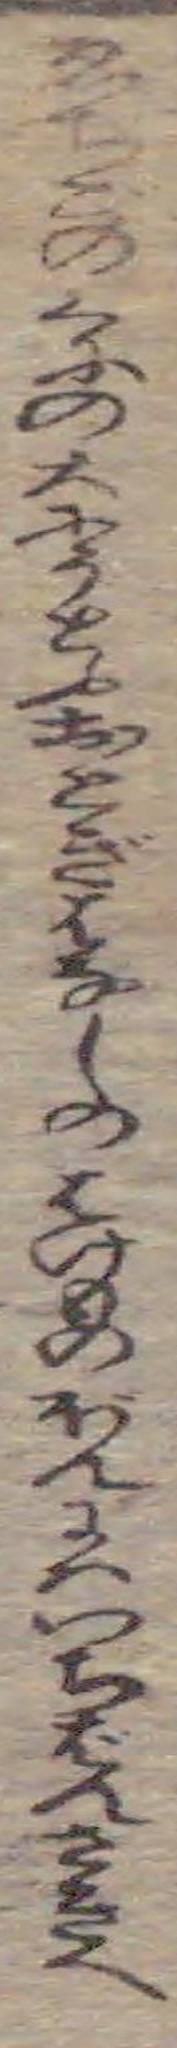えちこのくにの大にうとふおとぎはなしのはけものぼんにはいちばんさきへ
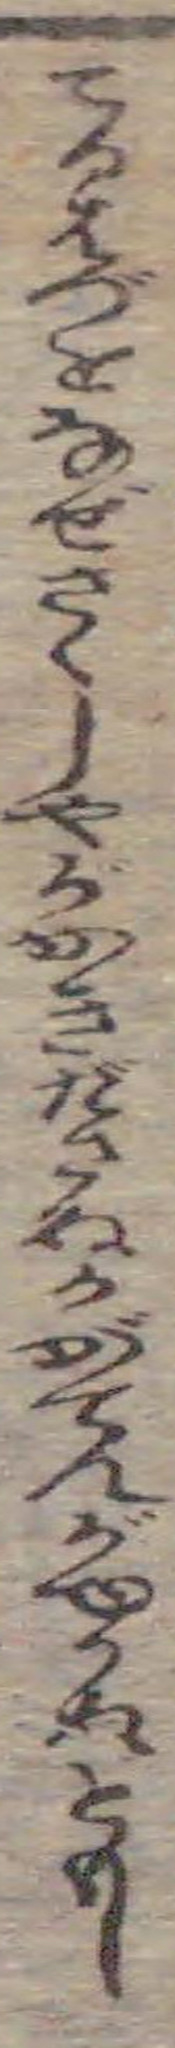てるはづをなぜさくしやがかきださぬかがてんがゆかぬともし
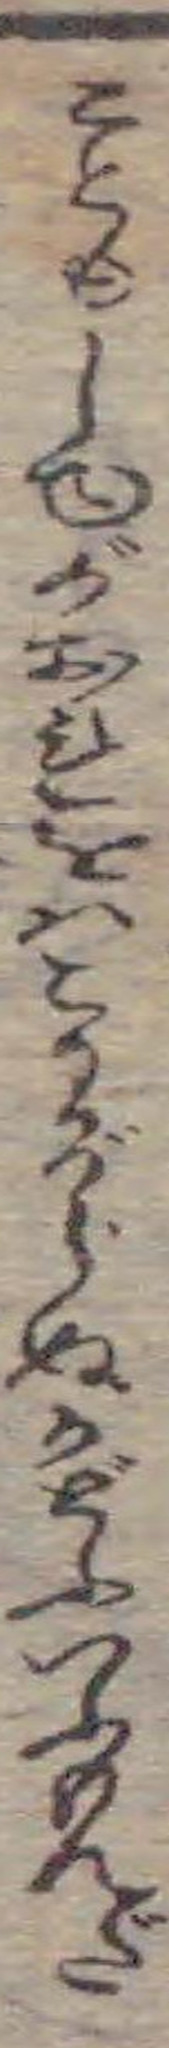こともしゆがおれをはこわがらぬかどふいうもんだ
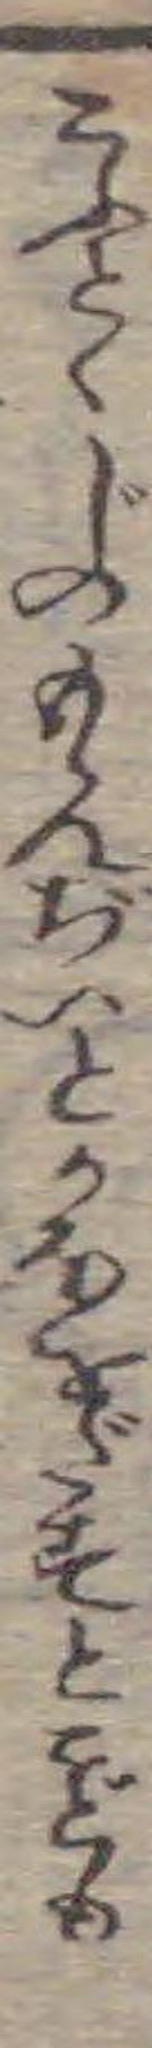こふとくじのもゝんぢいとかほをだすとこども
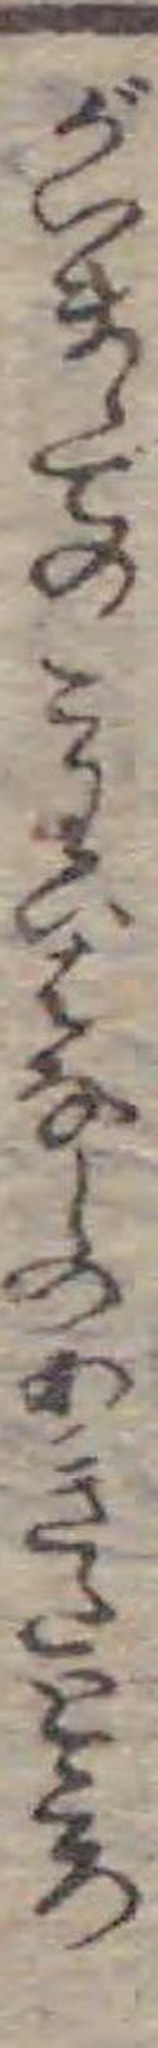がいまゝでのこわいはなしのあきたところ
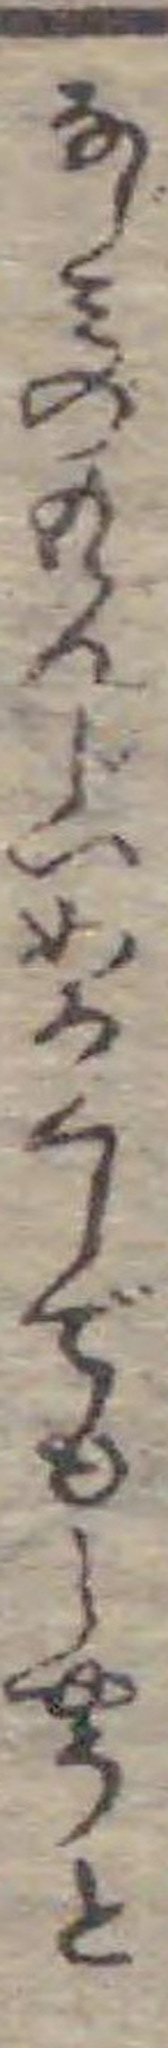なしみのもゝんじいめかくしでもしやうと
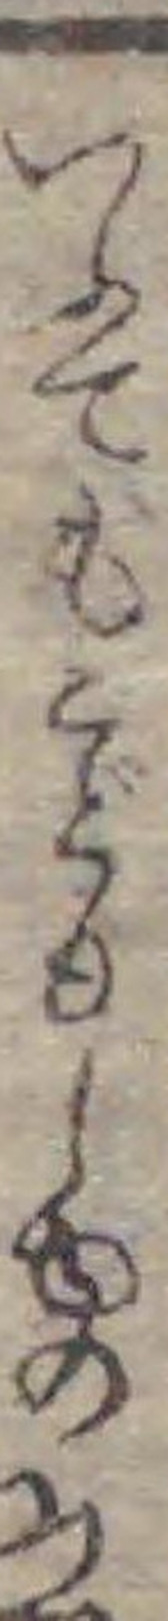いふてもこどもしゆの
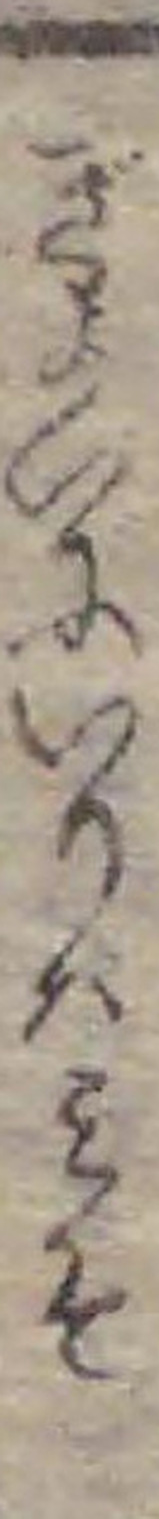ぎよいにいりはみそ
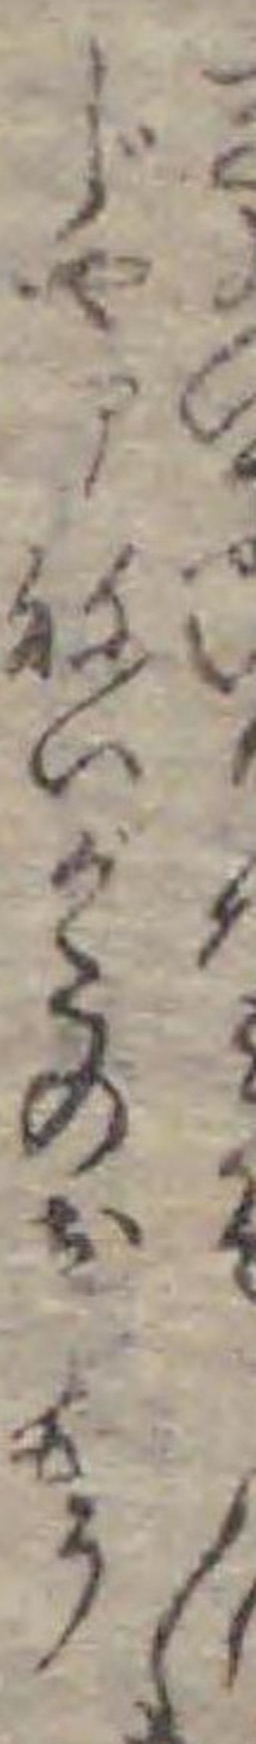じやァねいがこのおもう
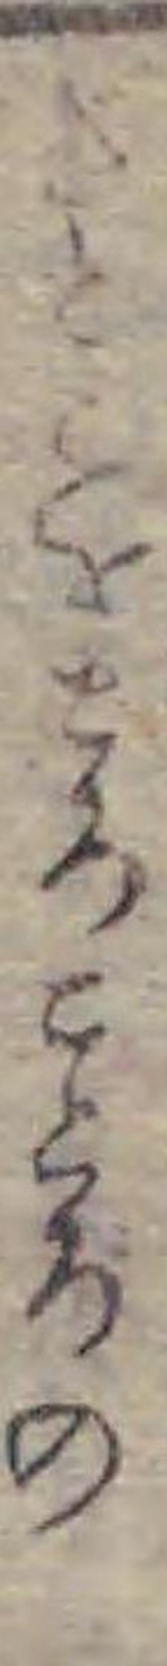だとこをとろことろの
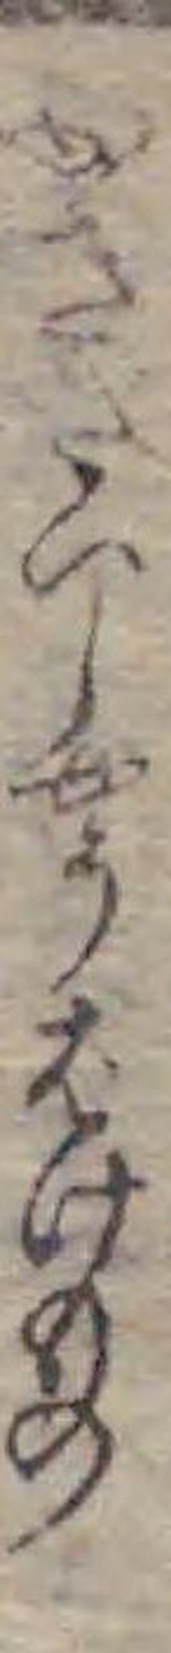かきだいしやうばけもの
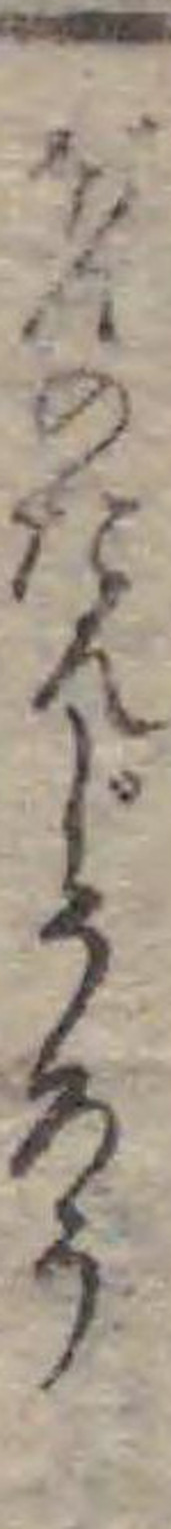ぼんのたんじうろう
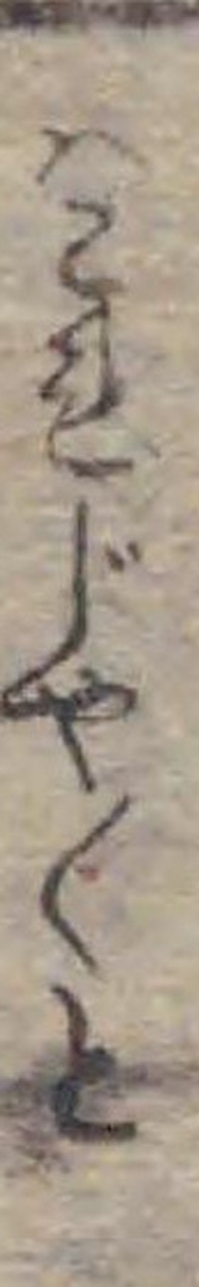はこれじや〳〵と
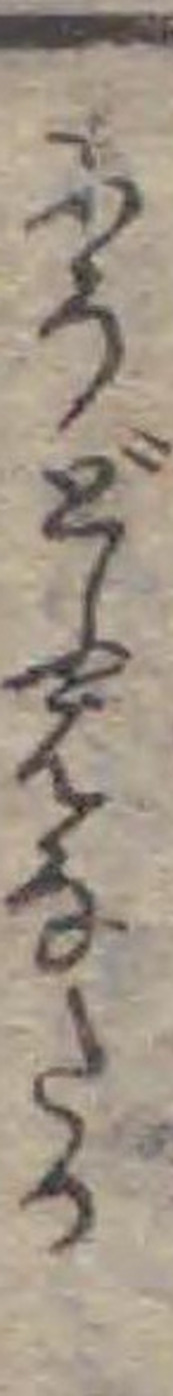にうどふはなたか
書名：変化物春遊 : 2巻
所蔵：国立国会図書館 National Diet Library, JAPAN
